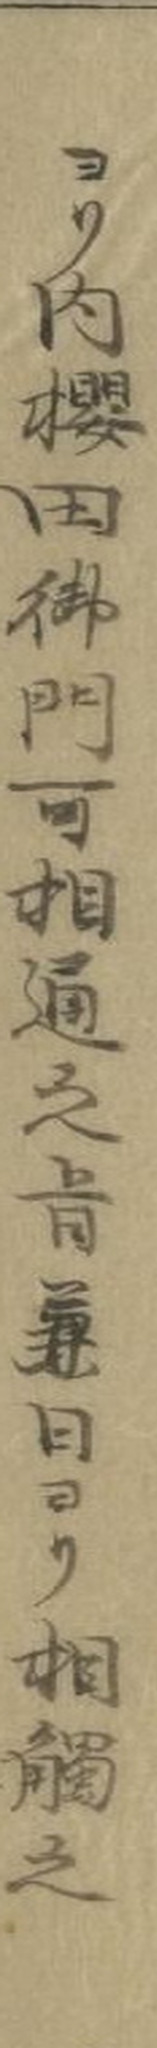ヨリ内桜田御門可相通之旨兼日ヨリ相触之
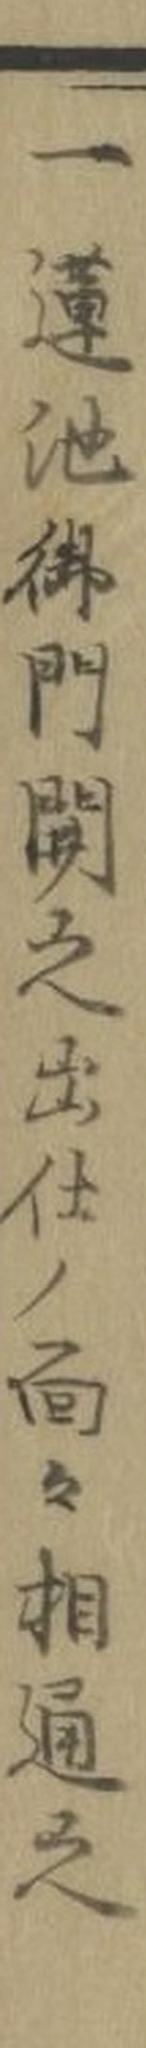一蓮池御門開之出仕ノ面々相通之

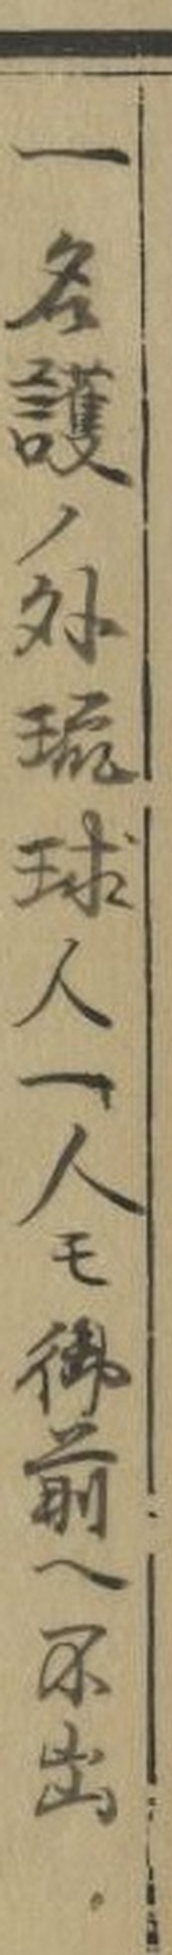一名護ノ外琉球人一人モ御前へ不出
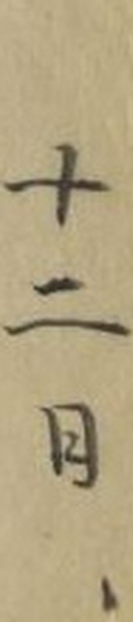十二日
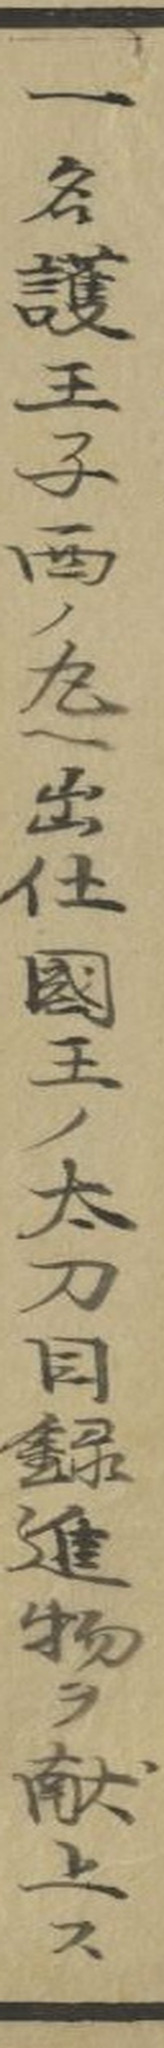一名護王子西ノ丸へ出仕国王ノ太刀目録進物ヲ献上ス
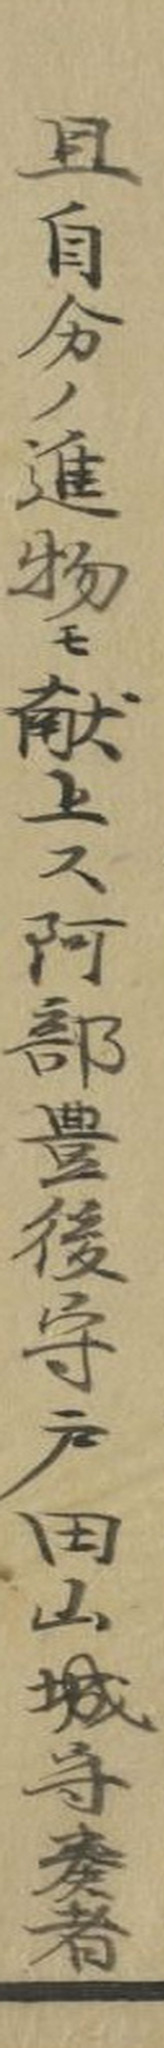且自分ノ進物モ献上ス阿部豊後守戸田山城守奏者
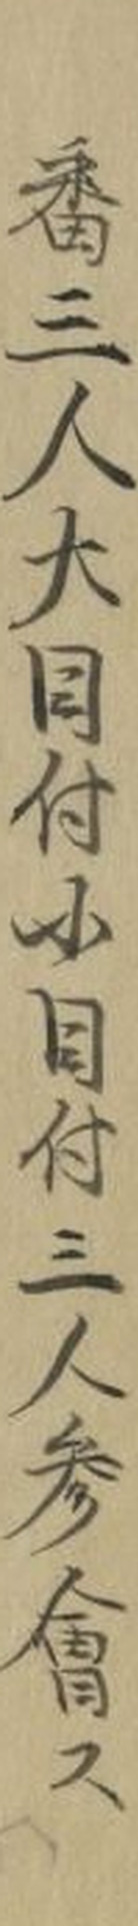番三人大目付小目付三人参会ス
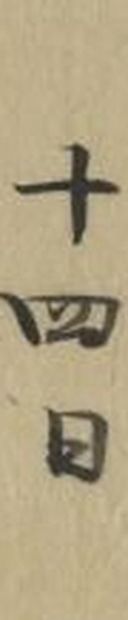十四日
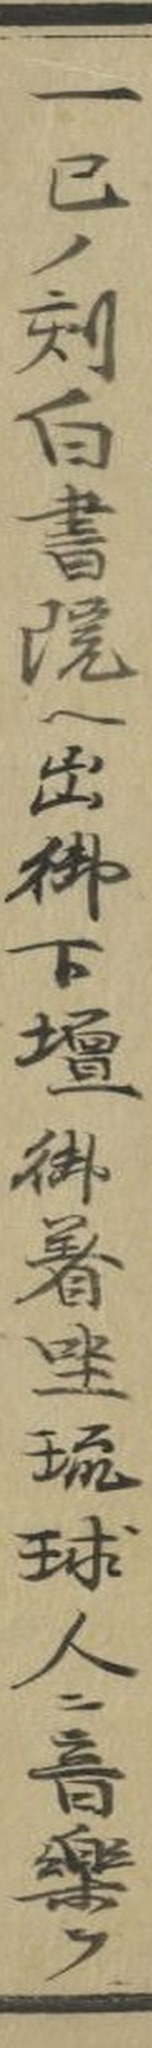一巳ノ刻白書院へ出御下壇御着座琉球人二音楽ヲ
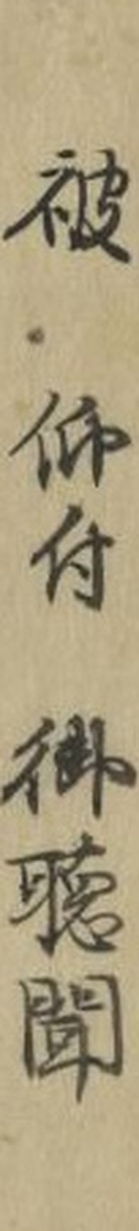被仰付御聴聞
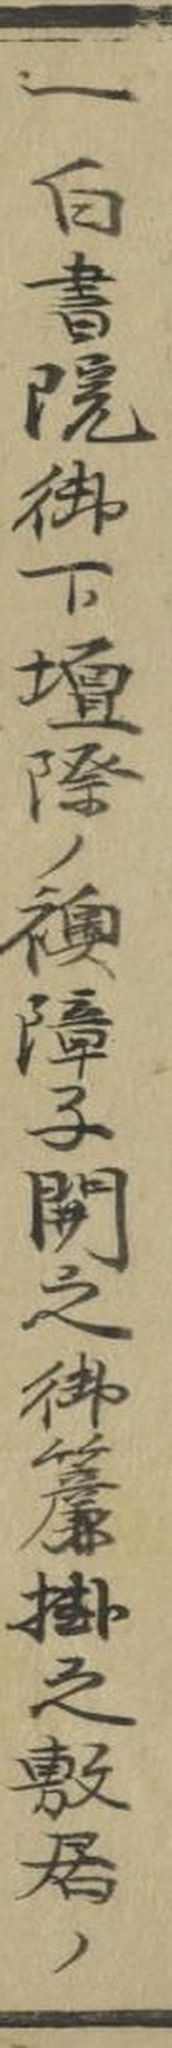一白書院御下壇際ノ襖障子開之御簾掛之敷居ノ
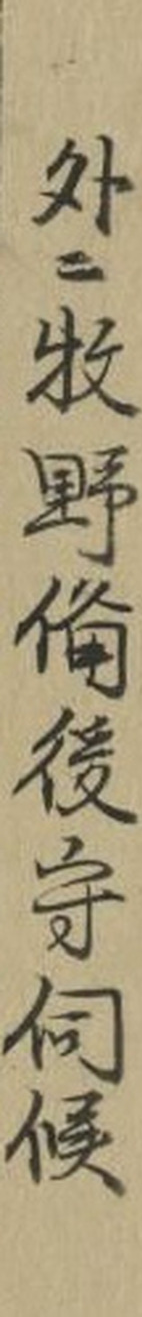外ニ牧野備後守伺候

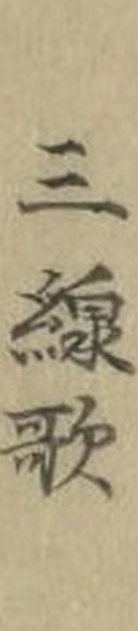三線歌
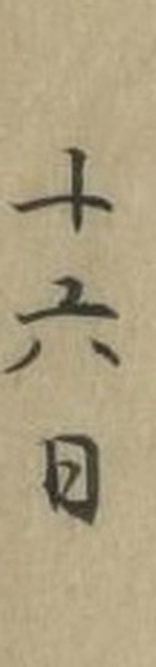十六日
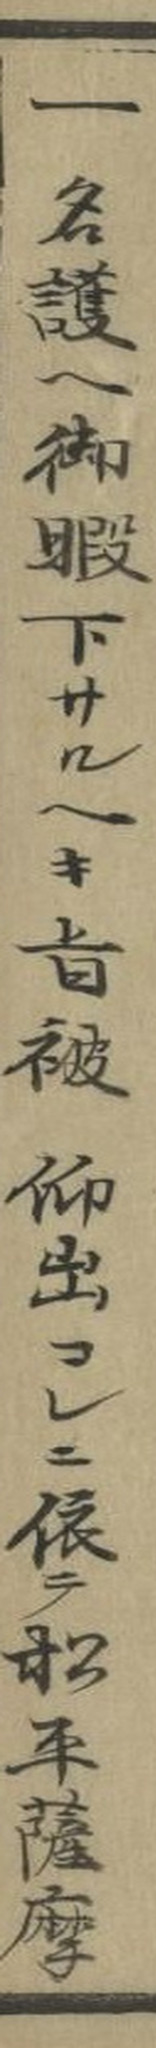一名護へ御暇下サルヘキ旨被仰出コレニ依テ松平薩摩

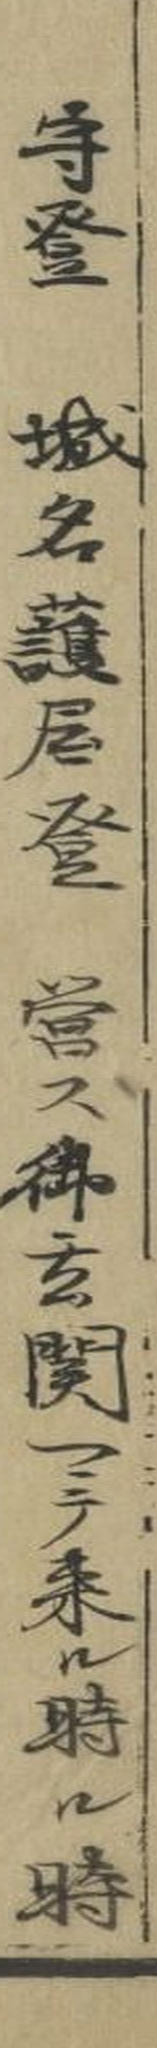守登城名護登営ス御玄関マテ来ル時ル時
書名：琉球往来（下）
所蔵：University of the Ryukyus Library
